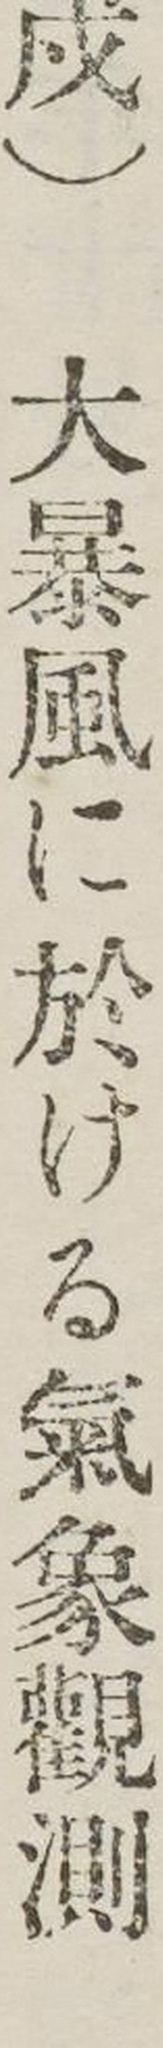大暴風に於ける気象観測
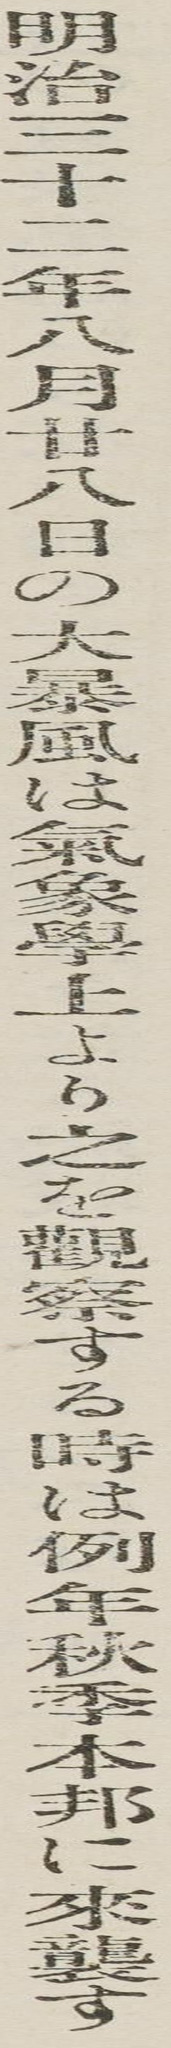明治三十二年八月廿八日の大暴風は気象学上より之を観察する時は例年秋季本邦に来襲す
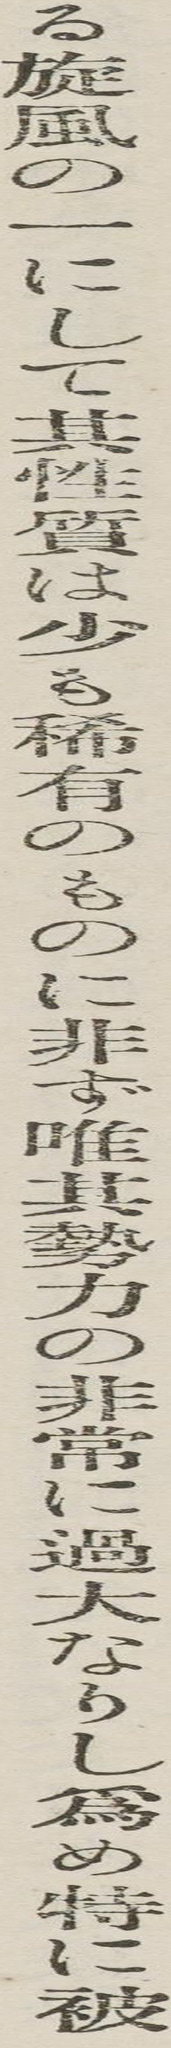る旋風の一にして其性質は少も稀有のものに非ず唯其勢力の非常に過大なりし為め特に被
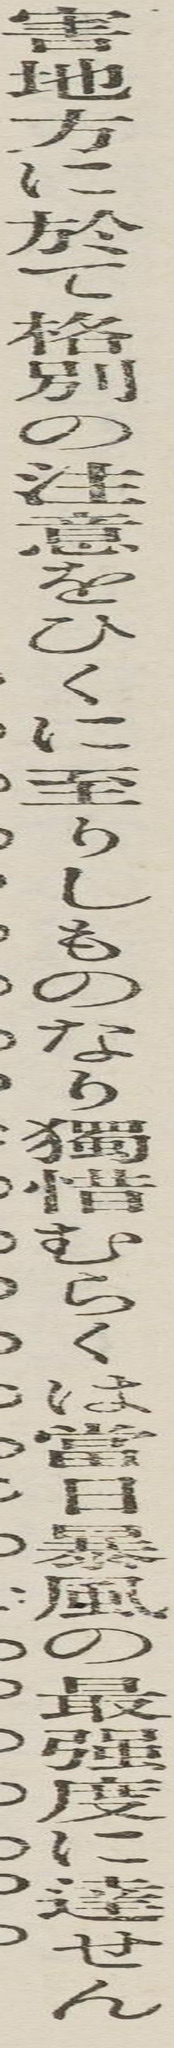害地方に於て格別の注意をひくに至りしものなり獨惜むらくは当日暴風の最強度に達せん

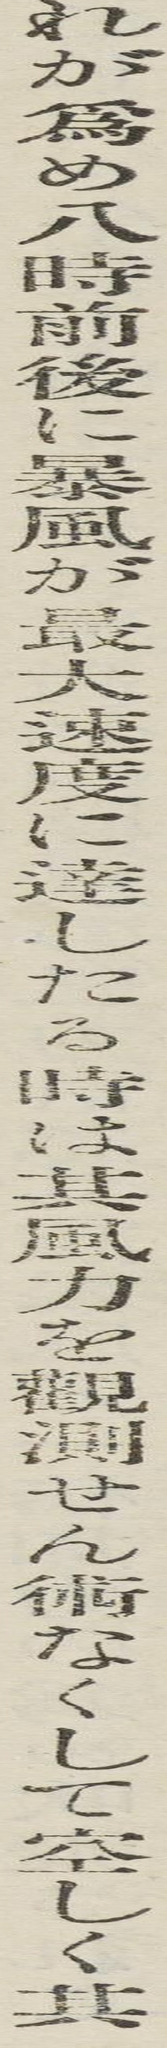れが為め八時前後に簿風が最大速度に達したる時は其風力を観測せん術なくして空しく其
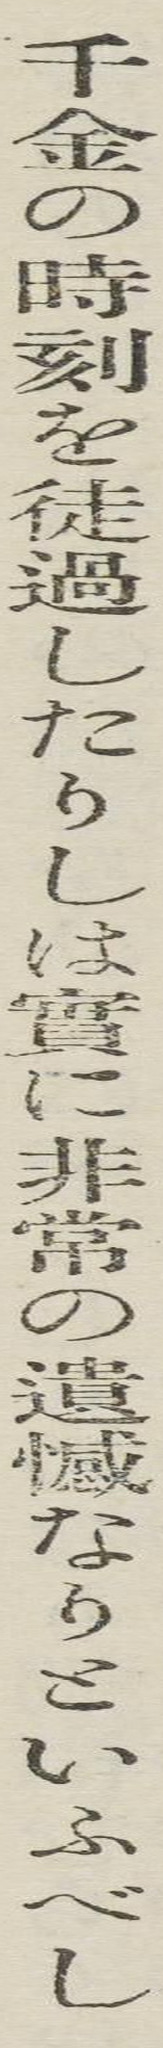千金の時刻を徒過したりしは実に非常の遺憾なりといふべし
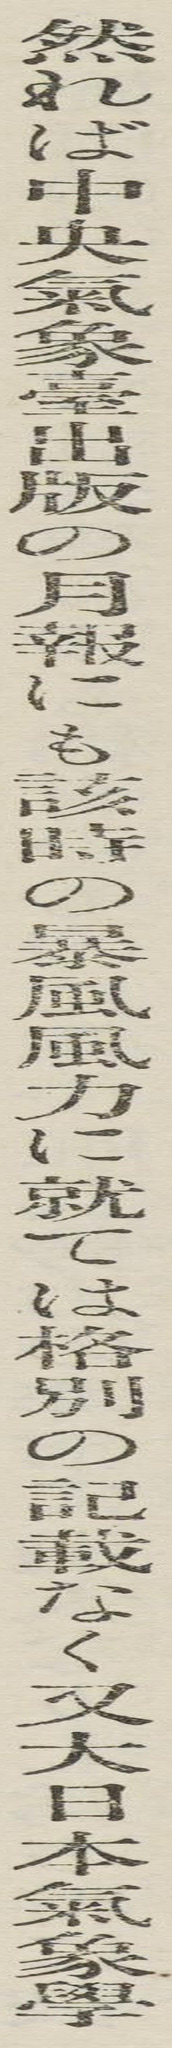然れば中央気象台出版の月報にも該時の暴風力に就ては格別の記載なく又大日本気象学
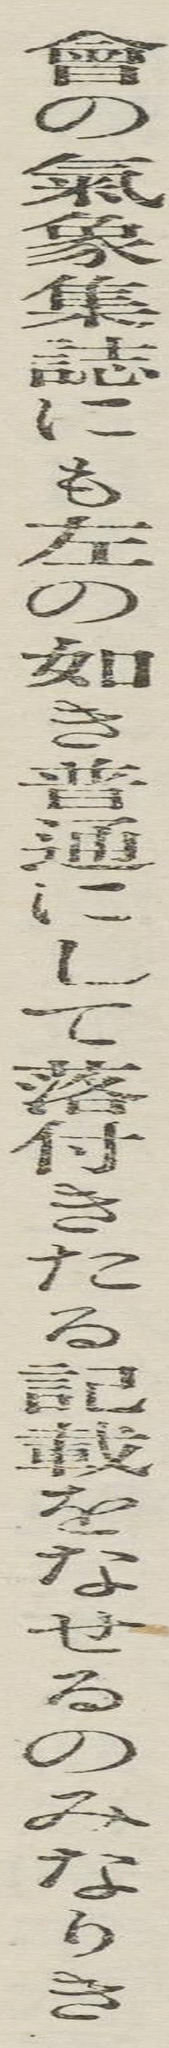会の気象集誌にも左の如き普通にして落付きたる記載をなせるのみなりき
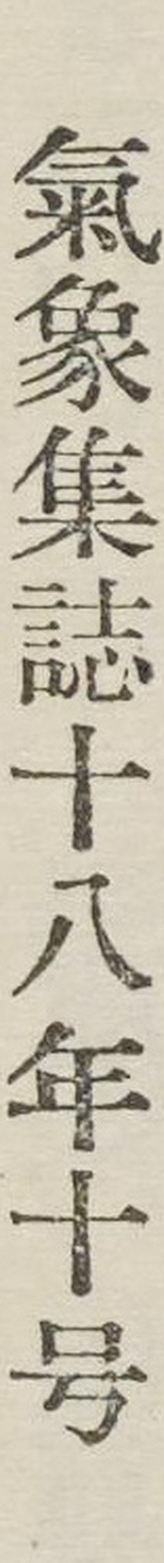気象集誌十八年十号
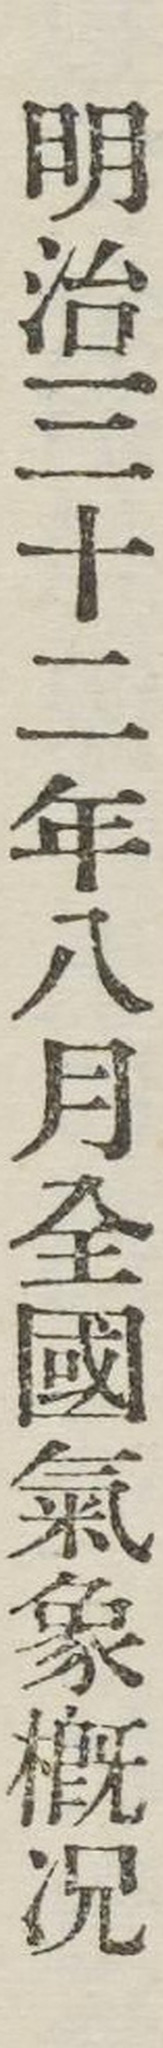明治三十二年八月全国気象概況
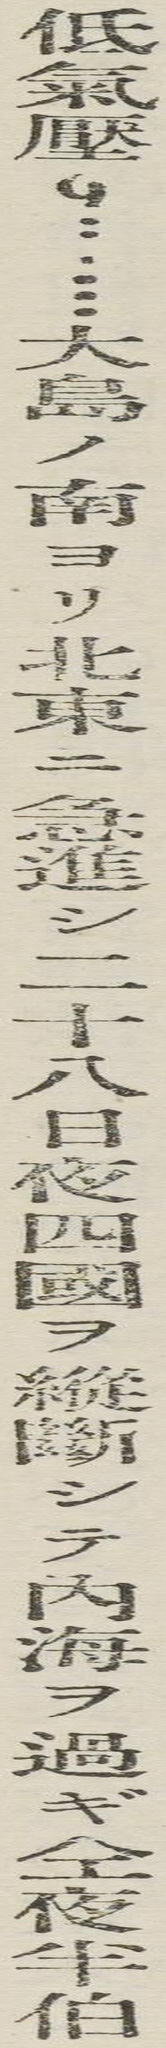低気圧・・・大島ノ南ヨリ北東ニ急進シ二十八日夜四国ヲ縦断シテ内海ヲ過ギ同夜半伯
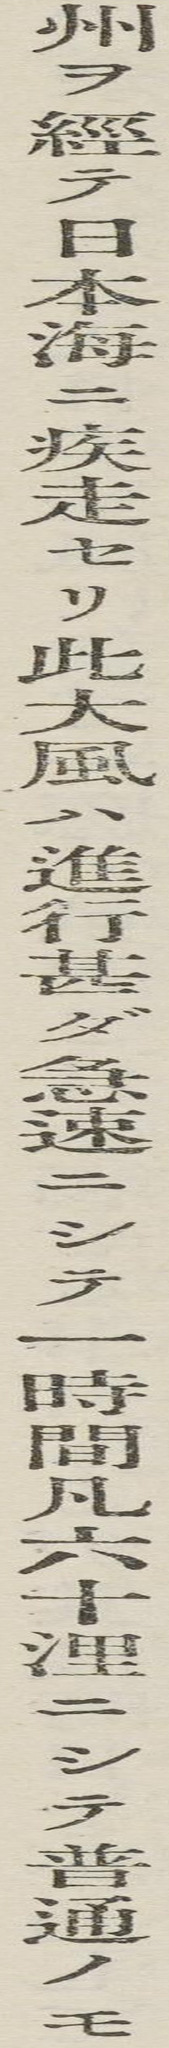州ヲ経テ日本海ニ疾走セリ此大風ハ進行甚ダ急速ニシテ一時間凡六十浬ニシテ普通ノモ
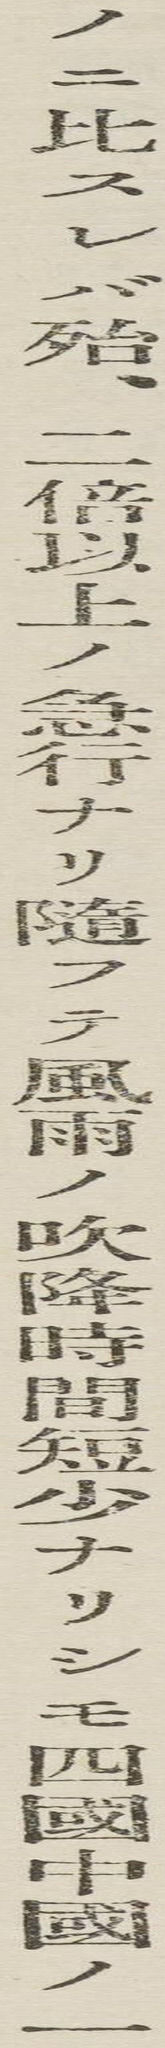ノニ比スレバ殆、二倍以上ノ急行ナリ随フテ風雨ノ吹降時間短少ナリシモ四国中国ノ一
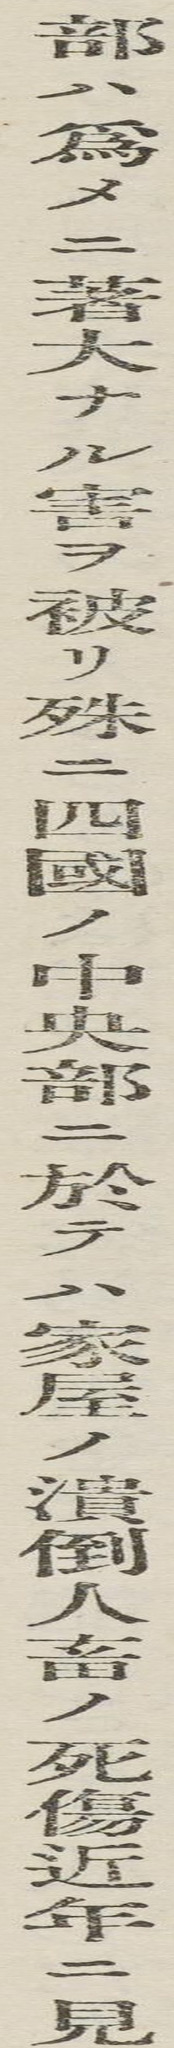部ハ為メニ著大ナル害ヲ被リ殊ニ四国ノ中央部ニ於テハ家屋ノ潰倒人畜ノ死傷近年ニ見
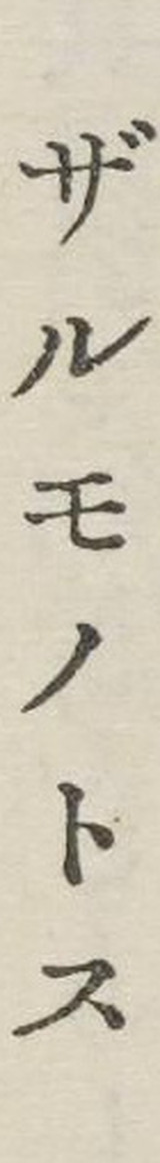ザルモノトス
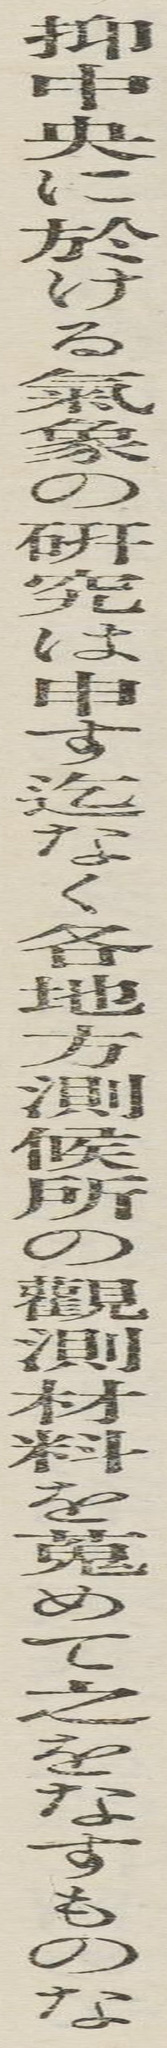抑中央に於ける気象の研究は申す迄なく各地方測候所の観測材料を集めて之をなすものな
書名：土佐古今ノ地震
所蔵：東京大学地震研究所図書室 Earthquake Research Institute Library, The University of Tokyo, JAPAN
